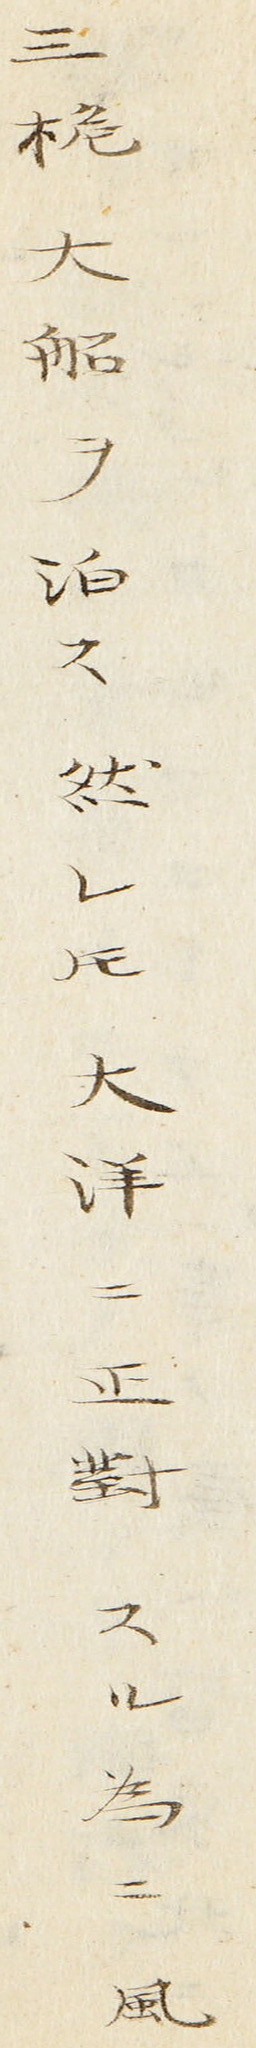三桅大船ヲ泊ス然レトモ大洋ニ正対スル為ニ風
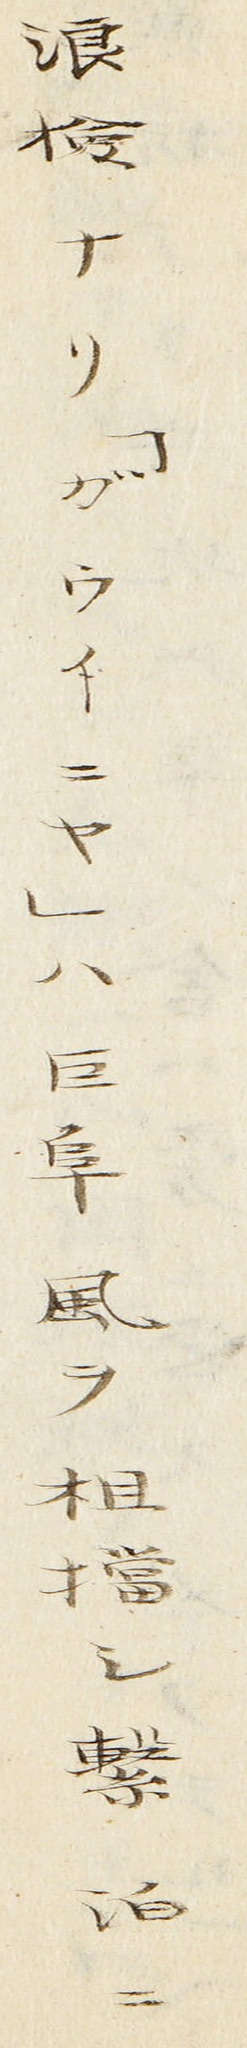浪検ナリ「ガウイニヤ」ハ巨阜風ヲ柤擋シ繋泊ニ
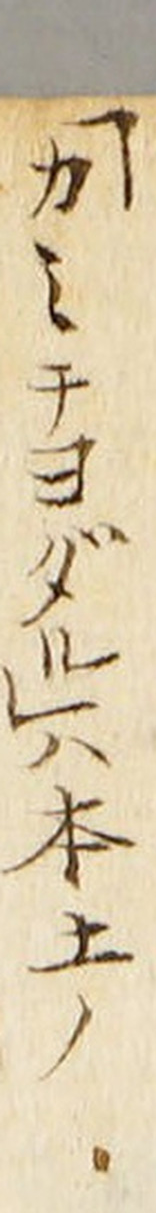「カミチヨダル」ハ本土ノ
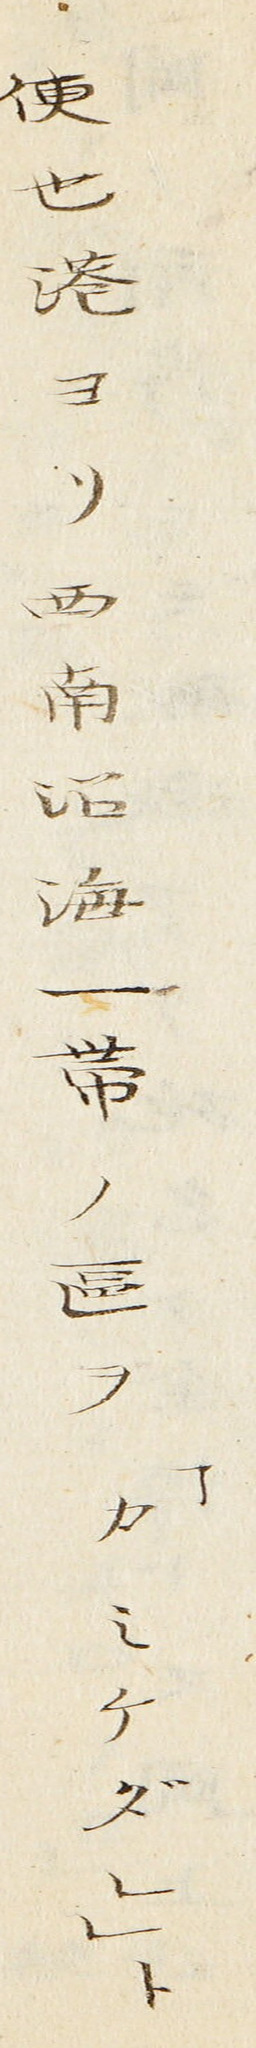便也港ヨリ西南沼海一帯ノ区ヲ「カミケダレ」ト
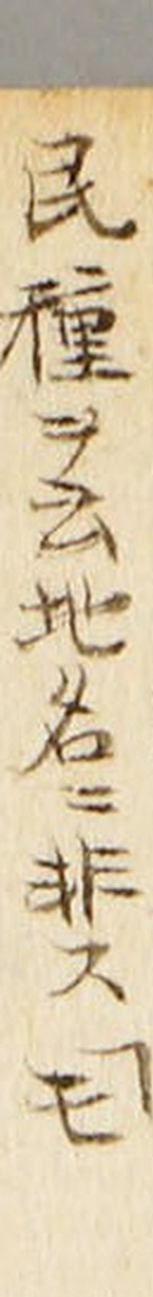民種ヲ云地名ニ非ス「モ
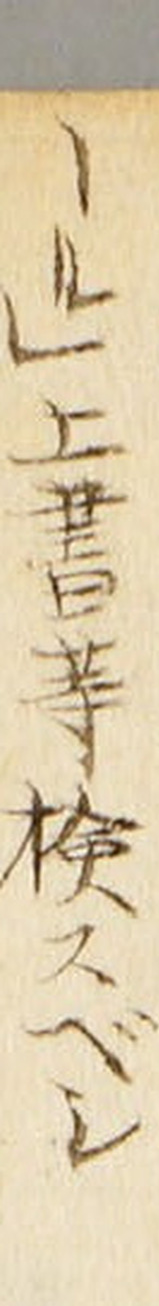ール」上書等検スベシ
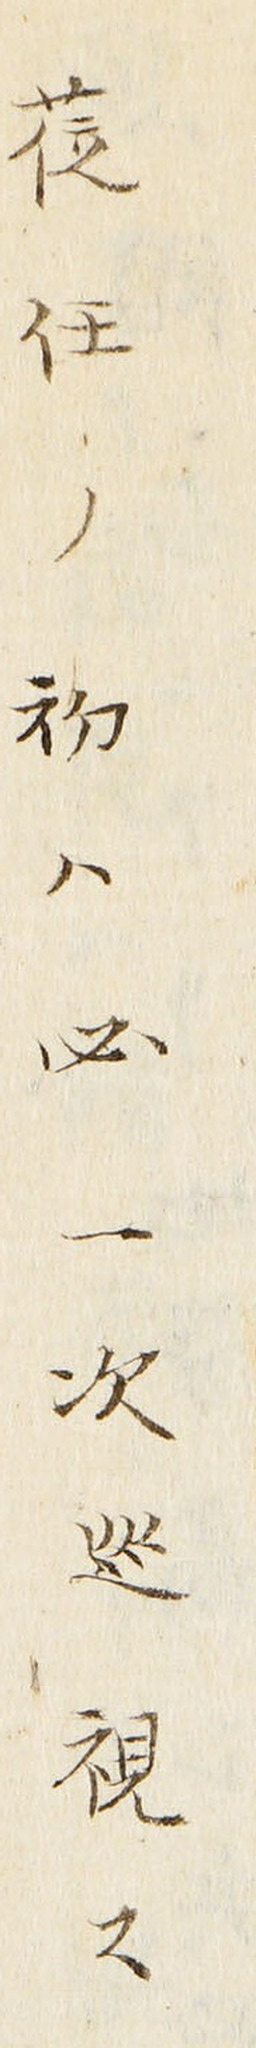莅任ノ初ハ必一次巡視ス
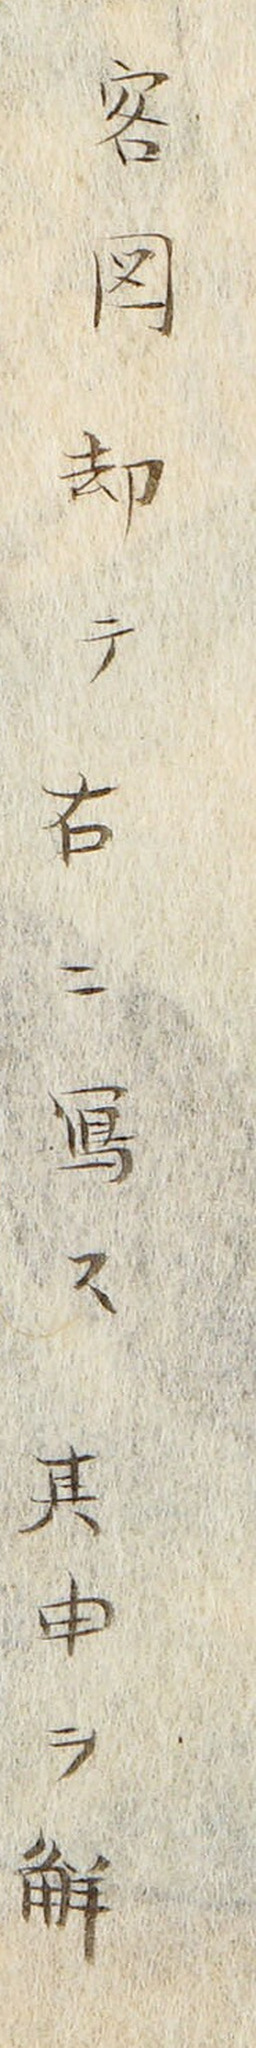客図却テ右ニ写ス其申ヲ觧

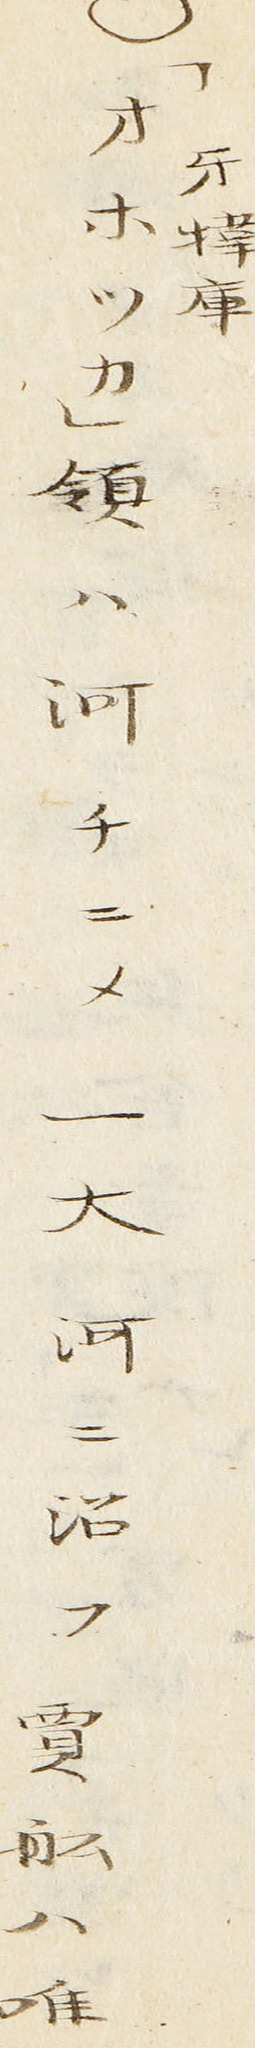○「オホツカ」領ハ河チニシテ一大河ニ沿フ賈船ハ唯
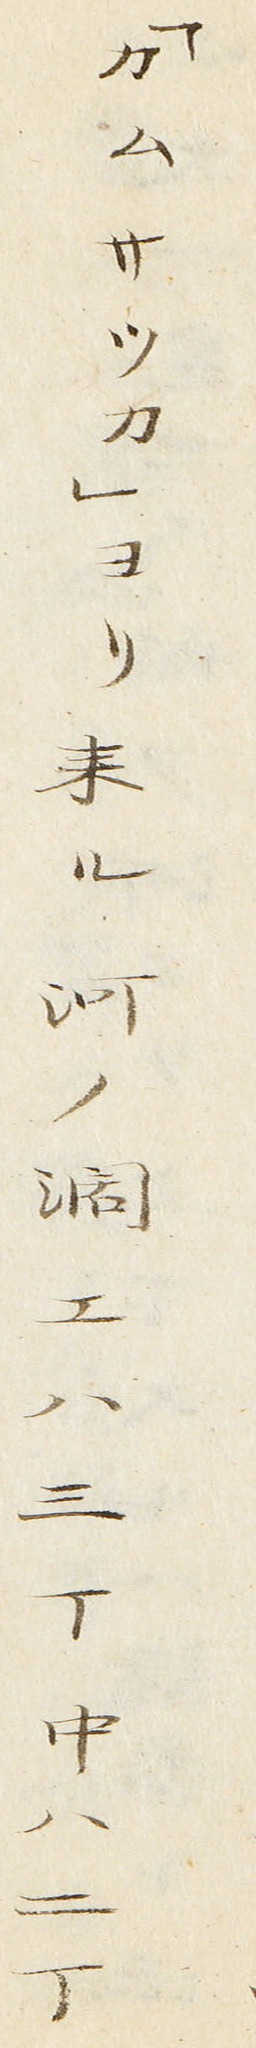「カムサツカ」ヨリ来ル河ノ濶エハ三丁中ハ二丁
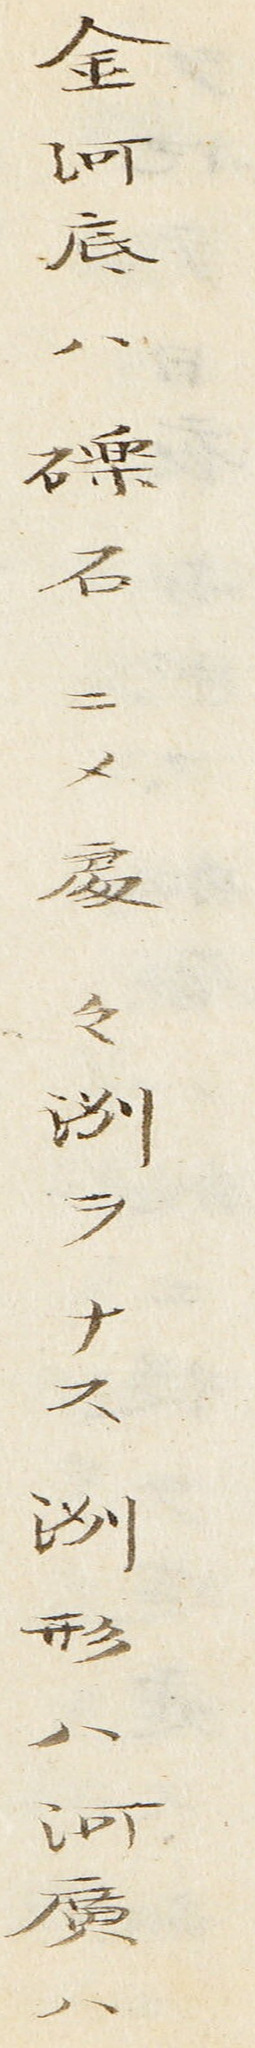金川底ハ礫石ニシテ処々洲ヲナス洲形ハ河広ハ
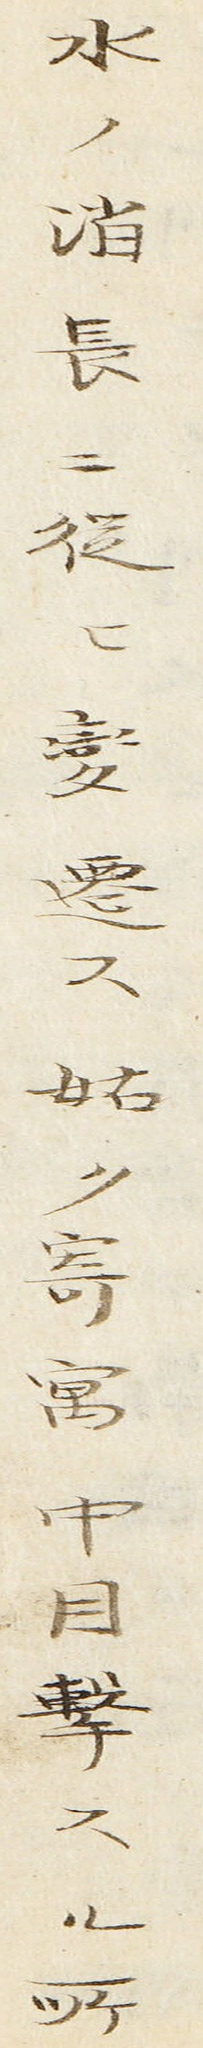水ノ消長ニ従ヒ変遷ス姑ク奇寓中目撃スル所
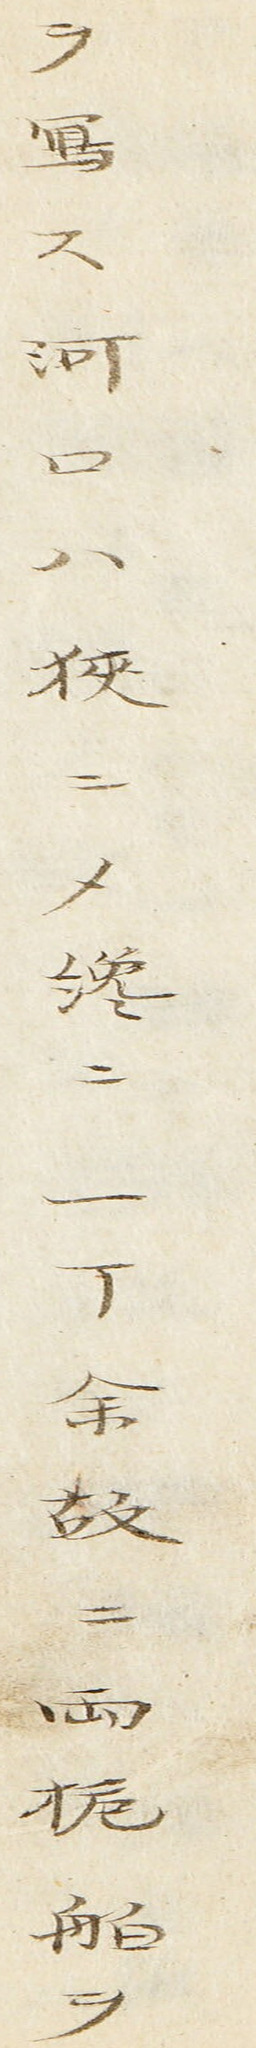ヲ写ス河口ハ狭ニシテ纔ニ一丁余故ニ両桅舶ヲ
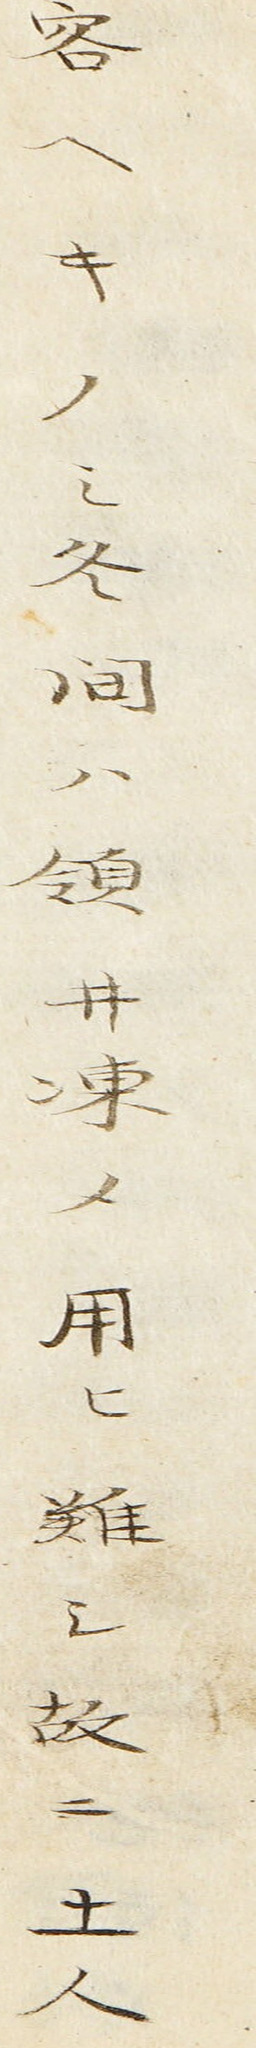客ヘキノミ冬間ハ領井凍シテ用ヒ難シ故ニ土人
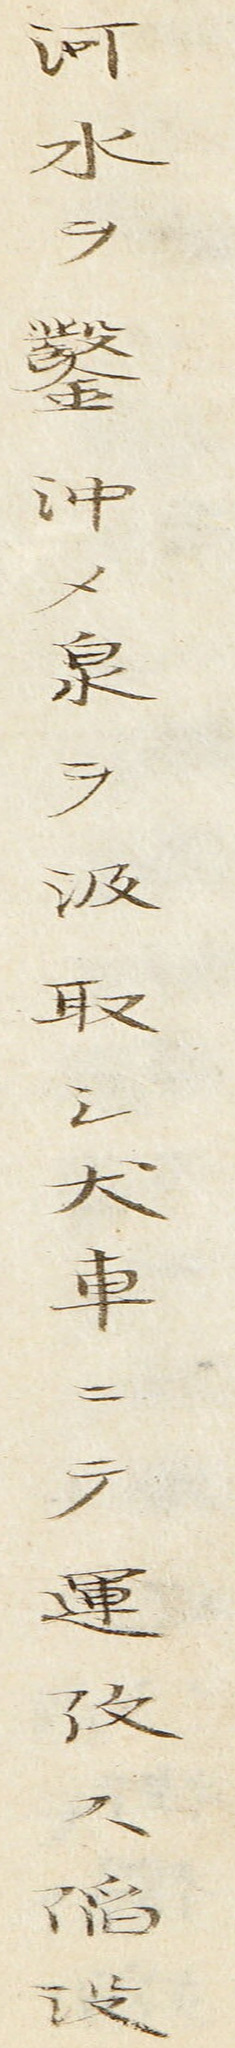河水ヲ鑿沖シテ泉ヲ汲取シ犬車ニテ運孜ス陥没
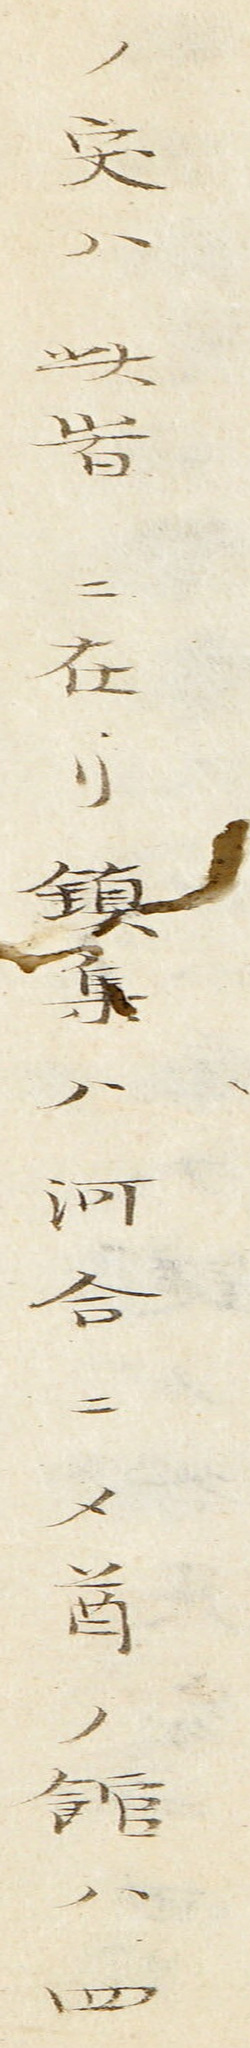ノ突ハ此旹ニ在リ鎮集ハ河合ニシテ酋ノ館ハ四
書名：流蕃通書
